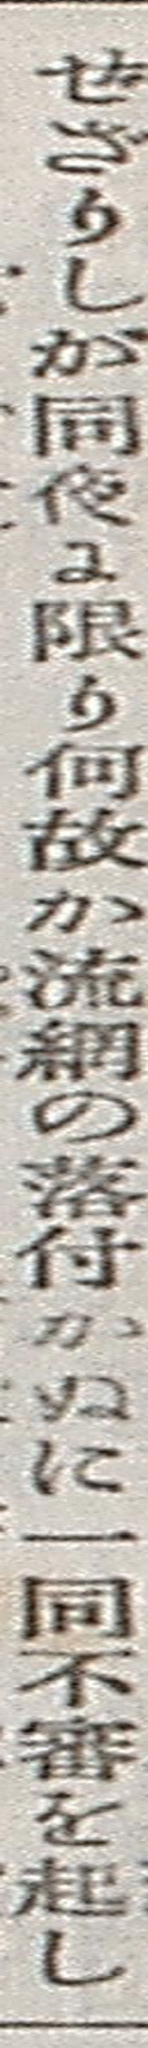ぜざりしが同夜に限り何故か流網の落付かぬに一同不審を起し
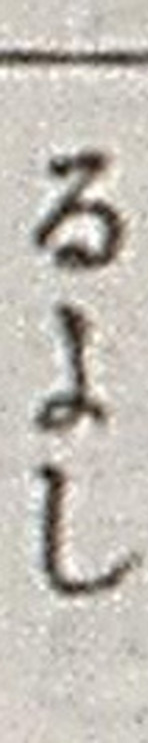るよし
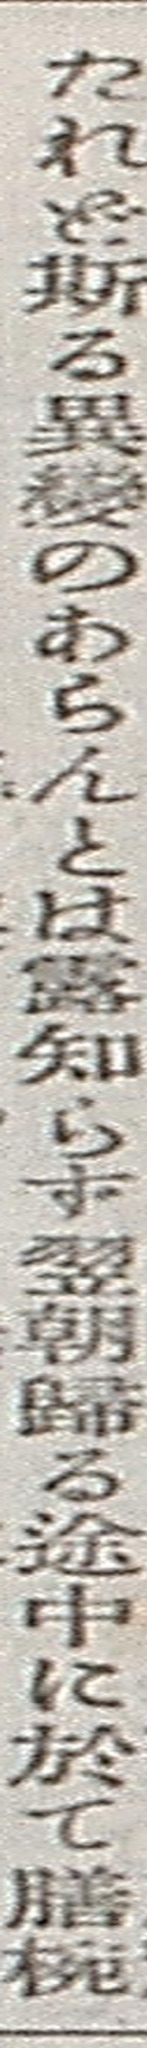たれど斯る異変のあらんとは露知らず翌朝帰る途中に於て膳椀
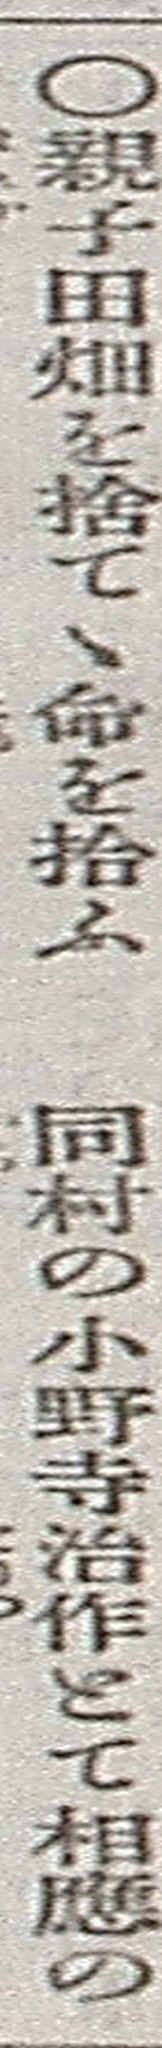○親子田畑を捨てゝ命を拾ふ同村の小野寺治作とて相応の
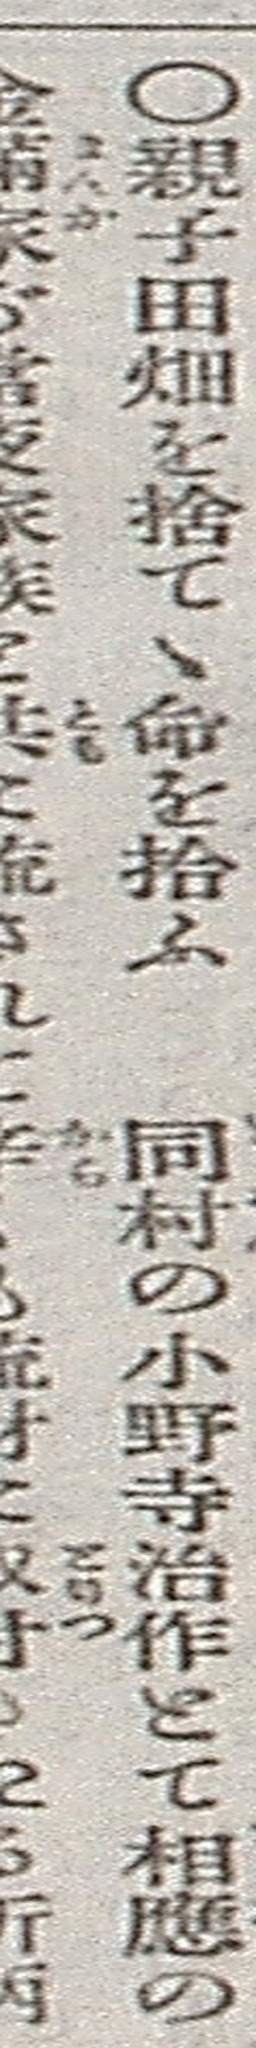金満家が当夜家族と共に流されて辛くも流材に取付きたる折柄
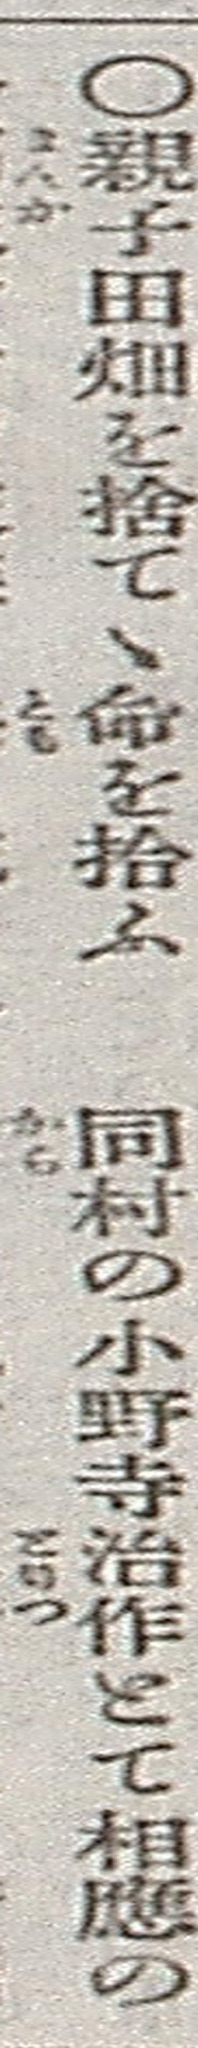○親子田畑を捨てゝ命を拾ふ同村の小野寺治作とて相応の
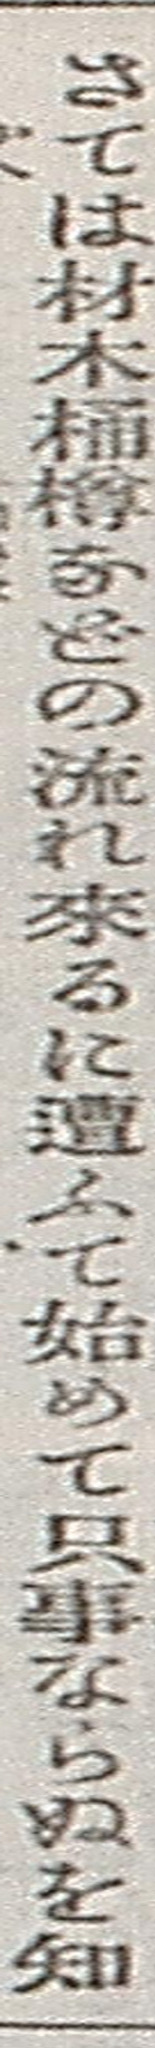さては材木桶樽などの流れ来るに遭ふて始めて只事ならぬを知
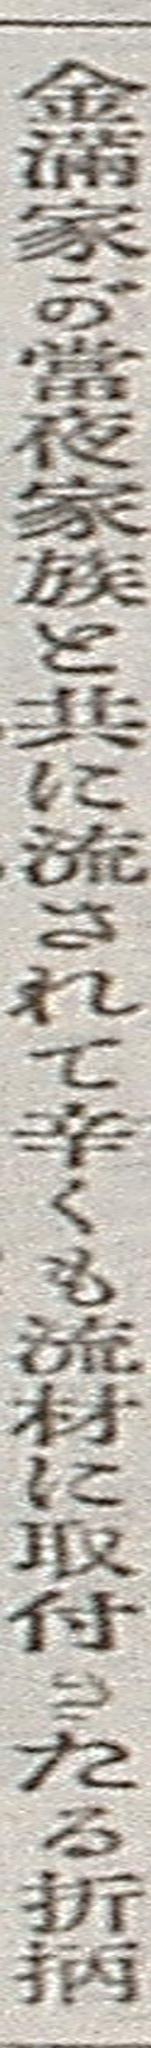金満家が当夜家族と共に流されて辛くも流材に取付きたる折柄
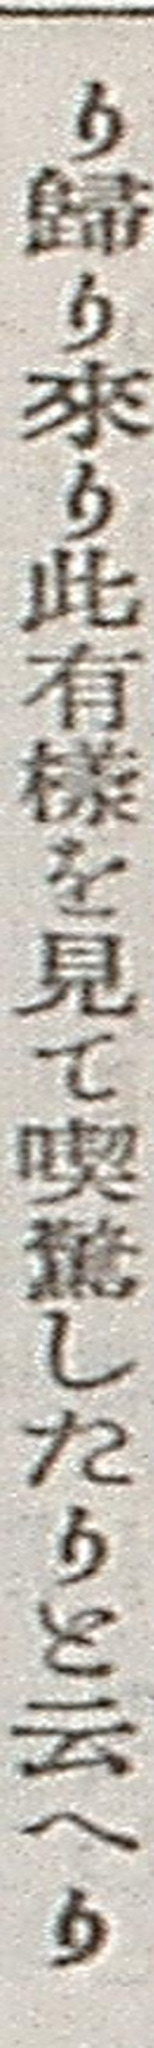り帰り来り此有様を見て喫驚したりと云へり
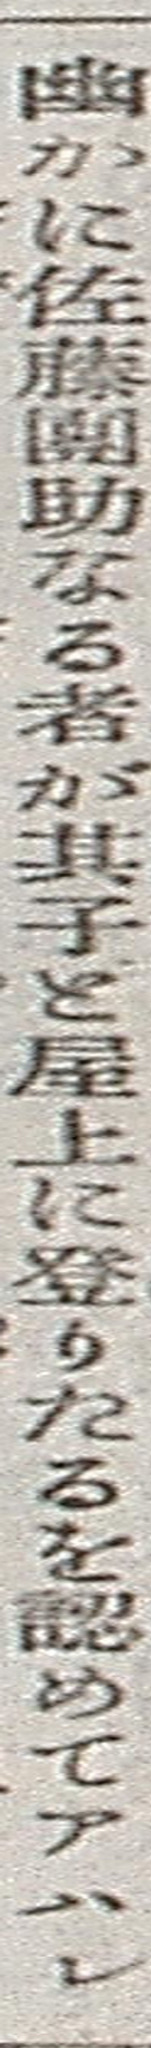幽かに佐藤団助なる者が其子と屋上に登りたるを認めてアハレ
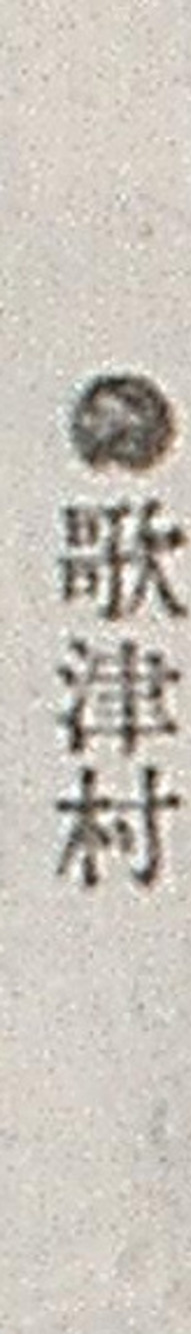●歌津村
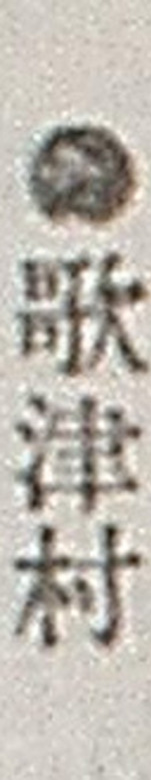●歌津村
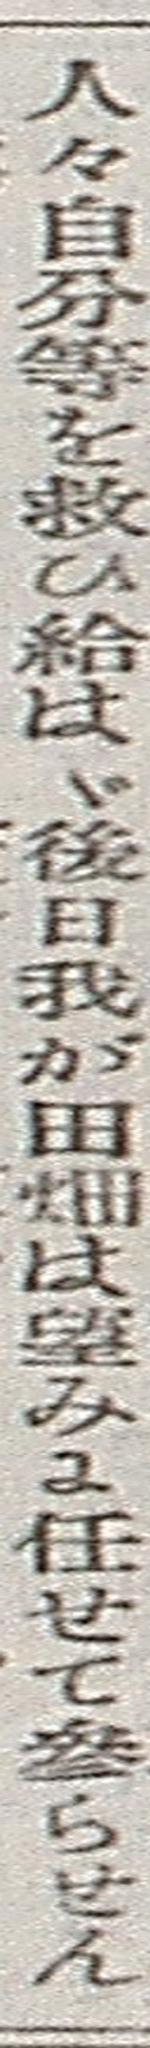人々自分等を救ひ給はゞ後日我が田畑は望みに任せて参らせん
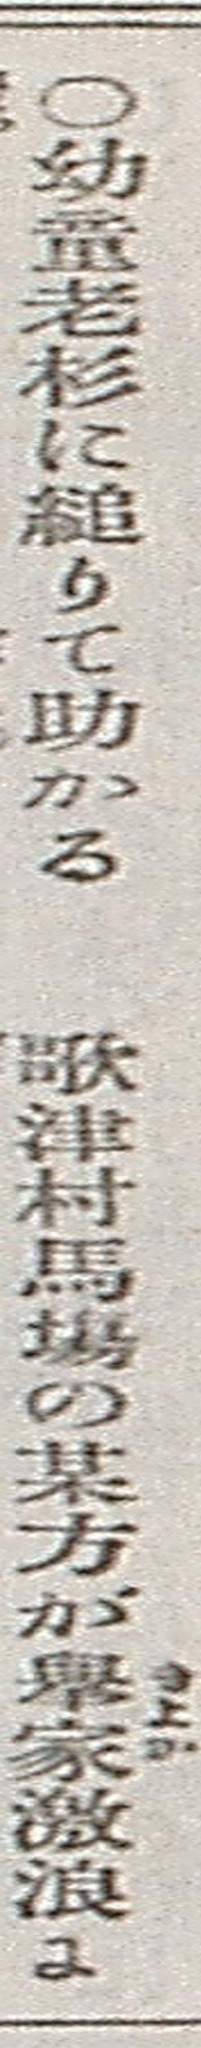○幼童老杉に縋りて助かる歌津村馬場の某方が挙家激浪に
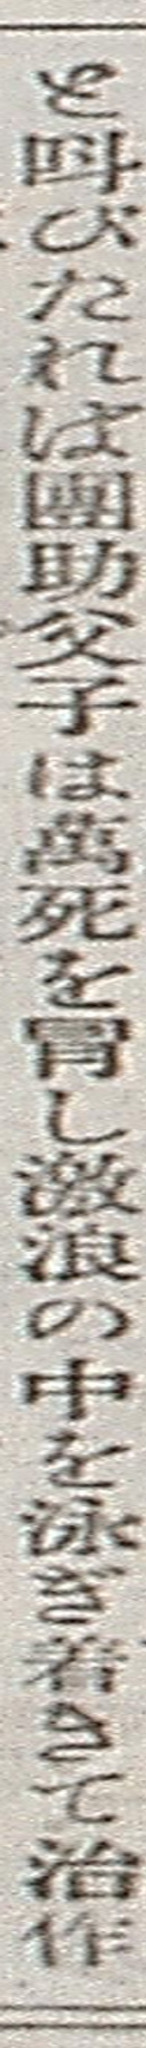と叫びたれば団助父子は万死を冐し激浪の中を泳ぎ着きて治作
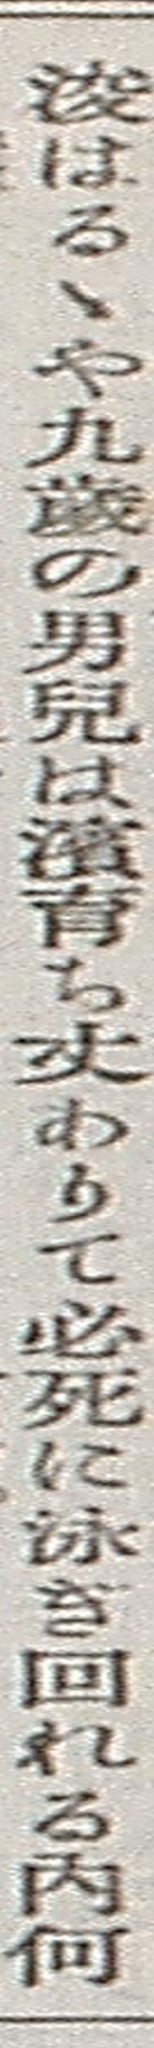浚はるゝや九歳の男兒は浜育ち丈ありて必死に泳ぎ回れる内何
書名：風俗畫報臨時増刊第百二十號　大海嘯被害録（下）
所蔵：東京大学地震研究所図書室 Earthquake Research Institute Library, The University of Tokyo, JAPAN
